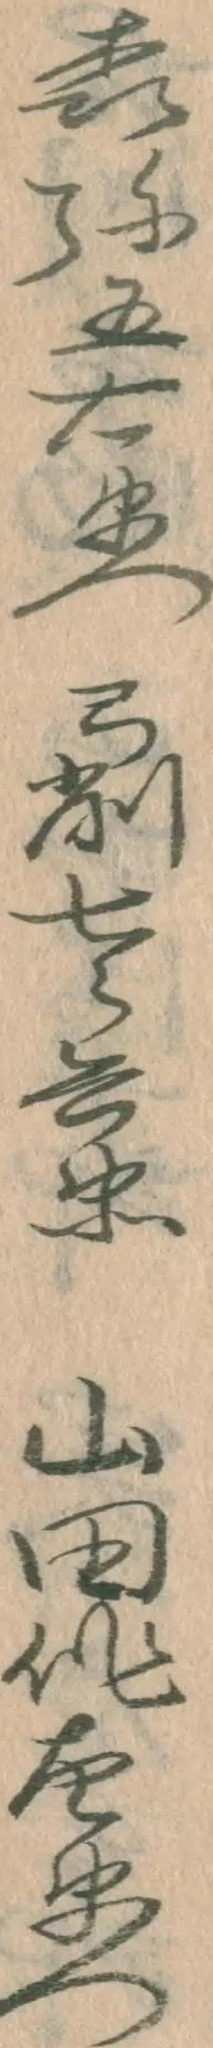森弥五左衛門弓削七郎兵衛山田作左衛門
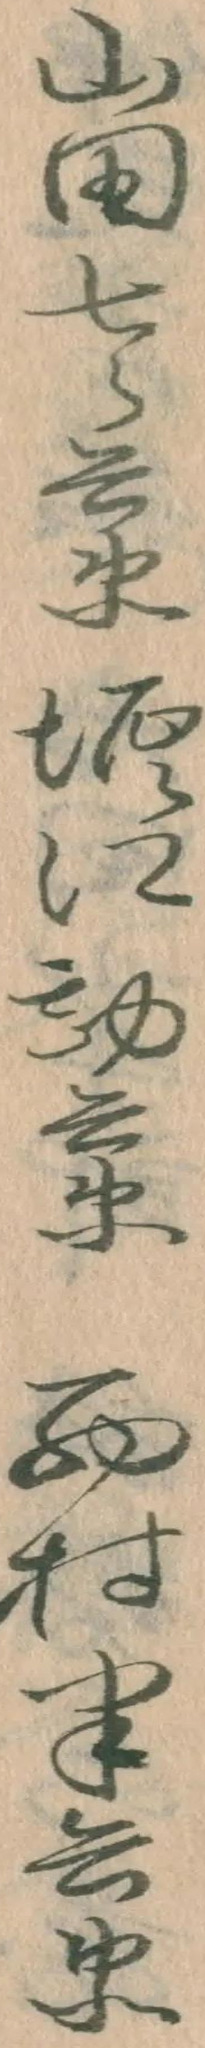山田七郎兵衛堀江干兵衛西村半兵衛
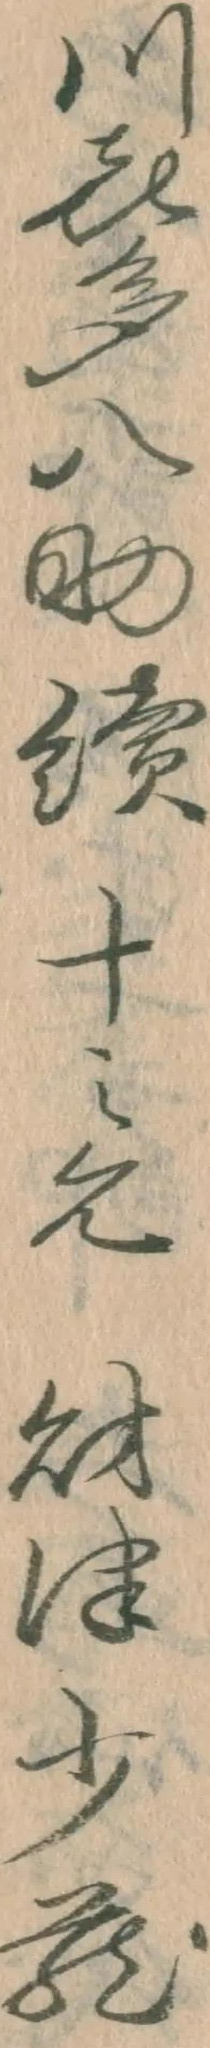川喜多八助続十之允財津少蔵
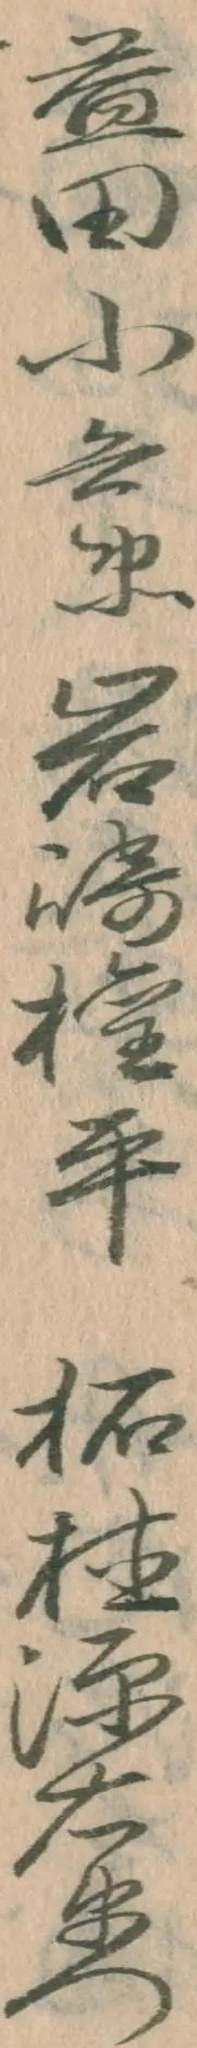増田小兵衛岩崎権平柘植源右衛門
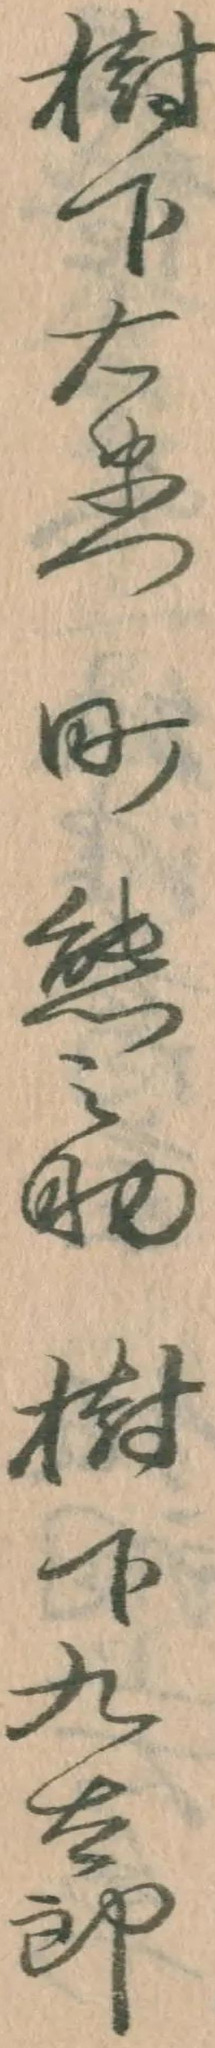樹下右衛門町熊之助樹下九太郎
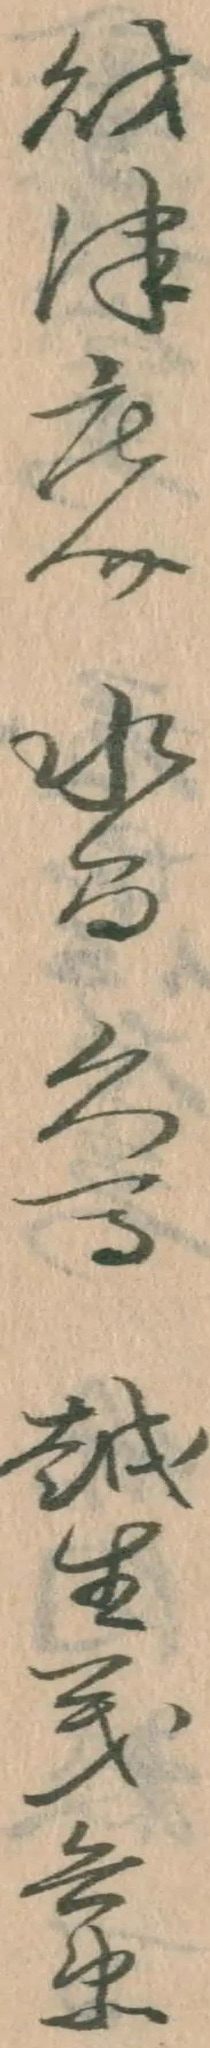財津右衛門水間久馬越生義兵衛
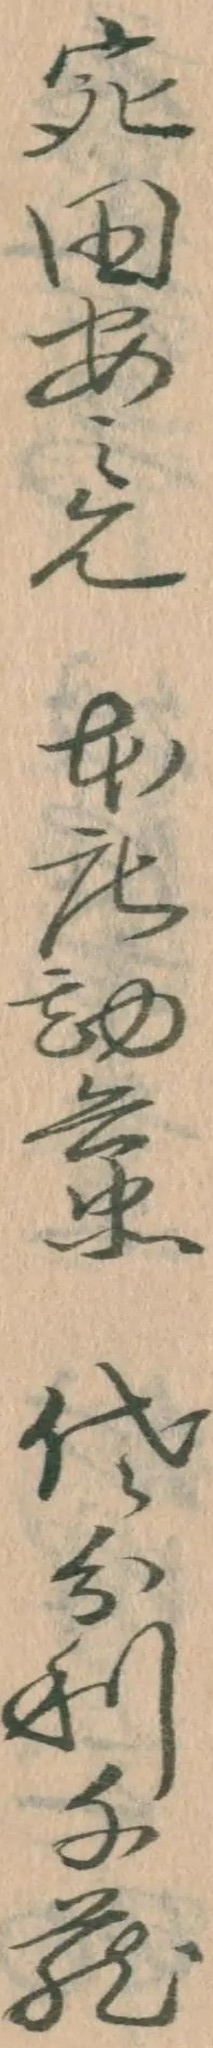宛田安之允本庄勘兵衛佐分利千蔵
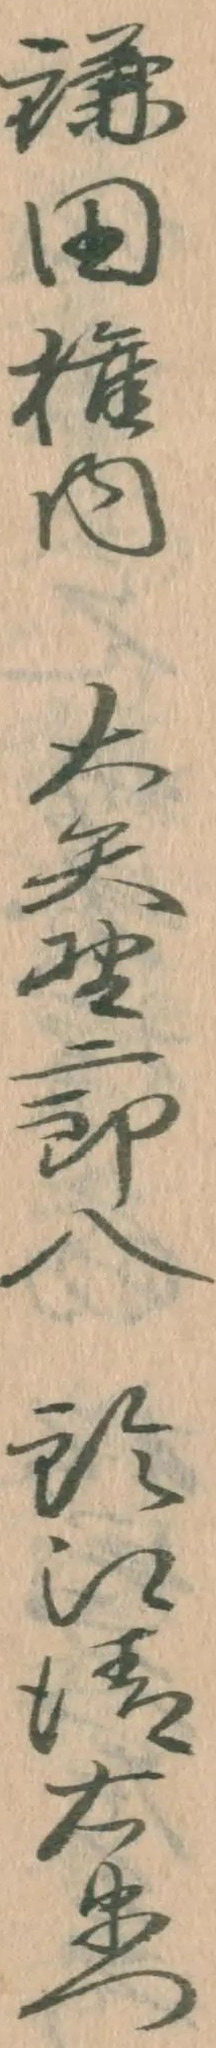鎌田権内大矢野二郎八鈴江清右衛門
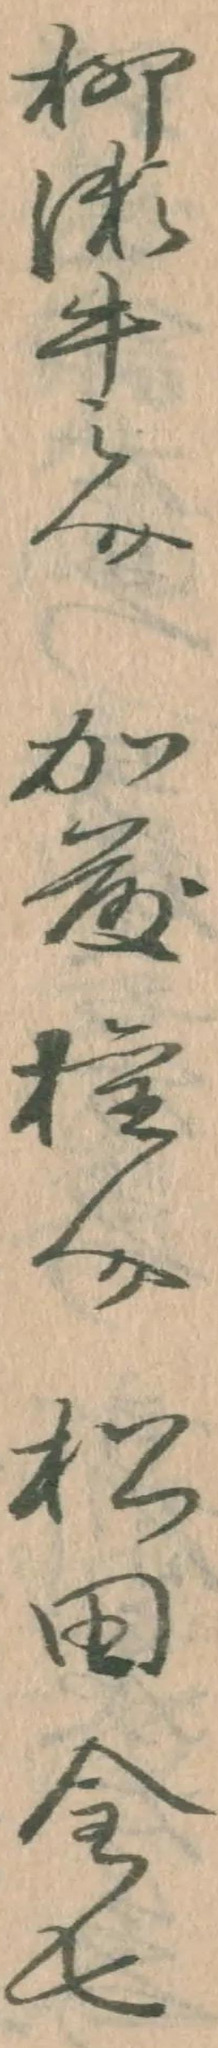柳瀬牛之介加藤権介松田金七
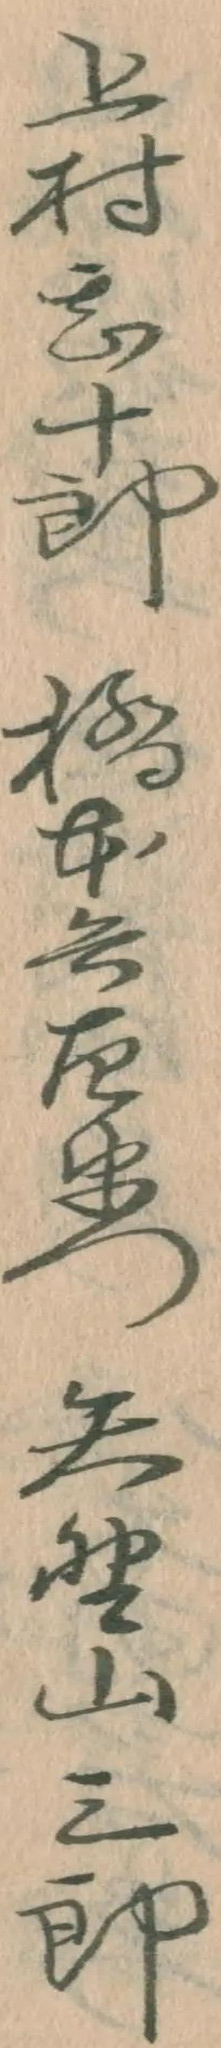植村甚十郎橋本兵左衛門矢野山三郎
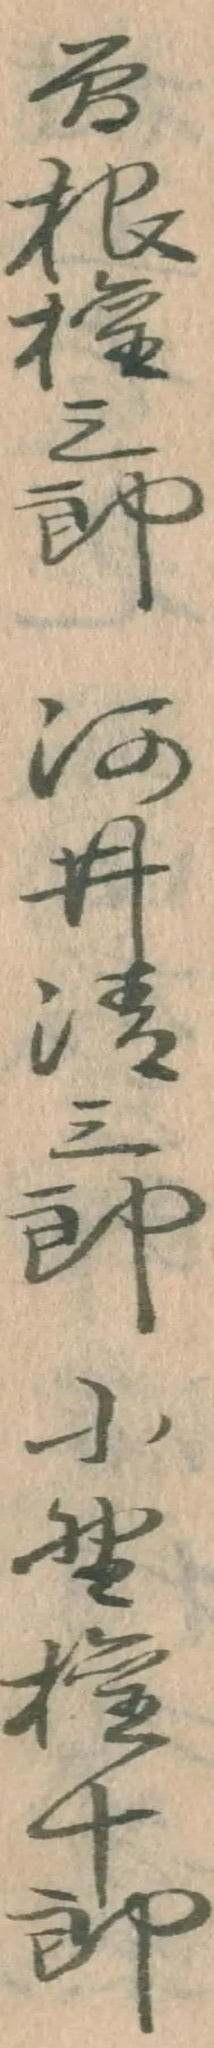曽根権三郎河井清三郎小野権十郎
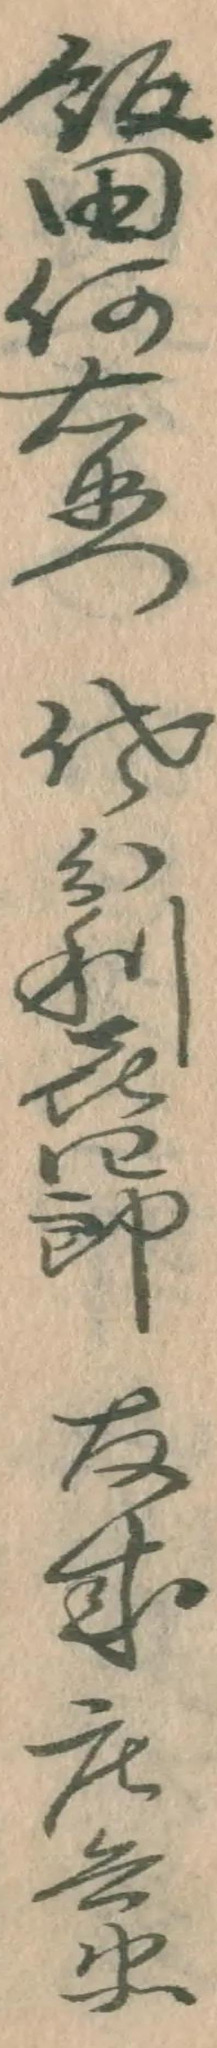飯田何右衛門佐分利喜四郎友成庄兵衛
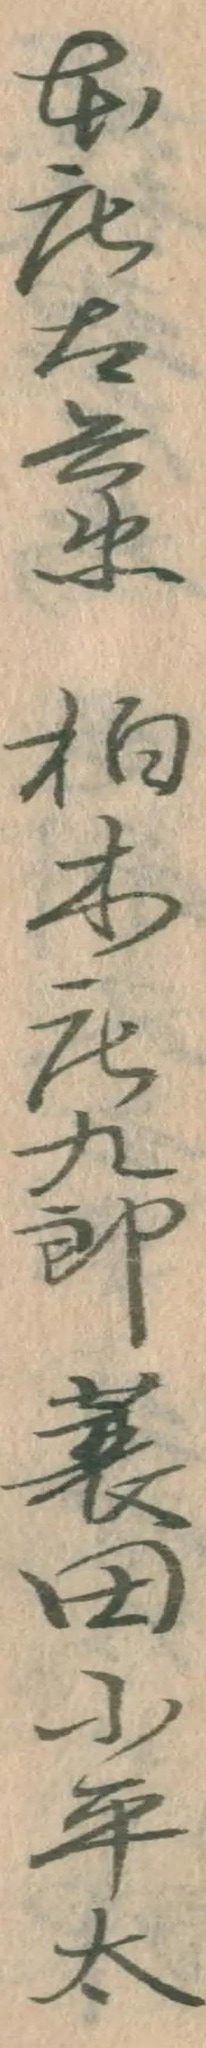本庄太兵衛柏木承九郎蓑田小平太
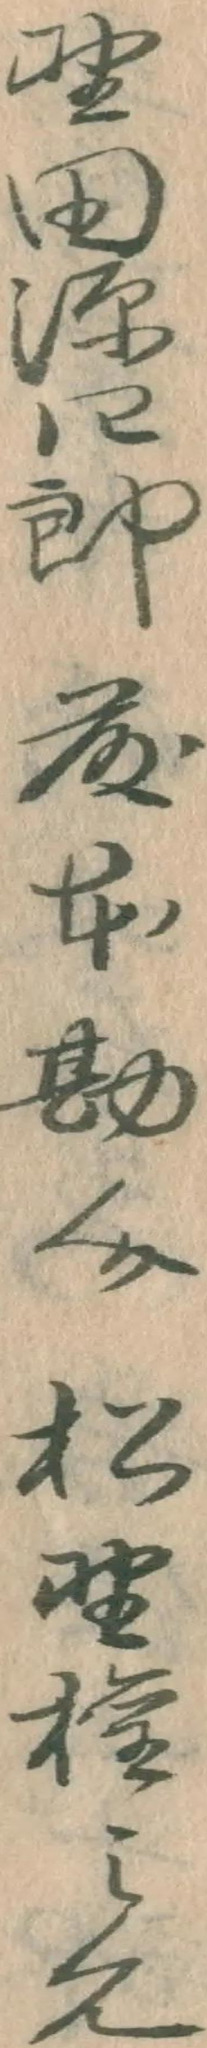野田源四郎藤本勘介松野権之允
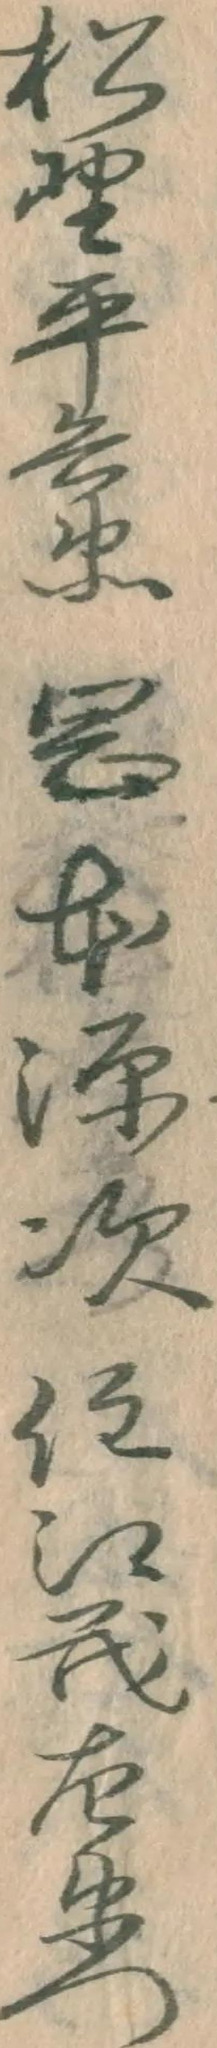松野平兵衛岡本源次住江茂左衛門
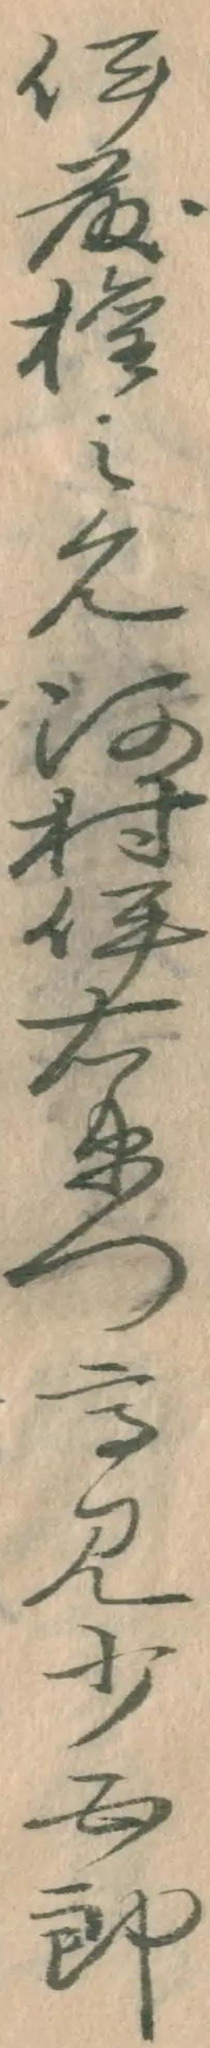伊藤権之允河村伊右衛門高見少五郎
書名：切支丹御退治記 49巻. [9]
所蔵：国立国会図書館 National Diet Library, JAPAN
